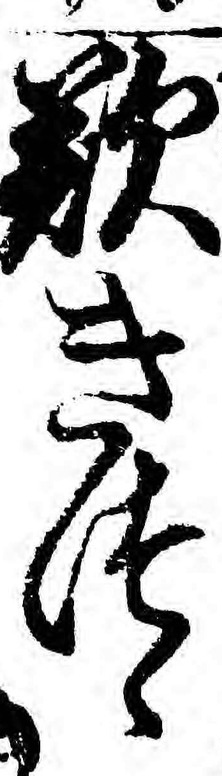歎きつゝ
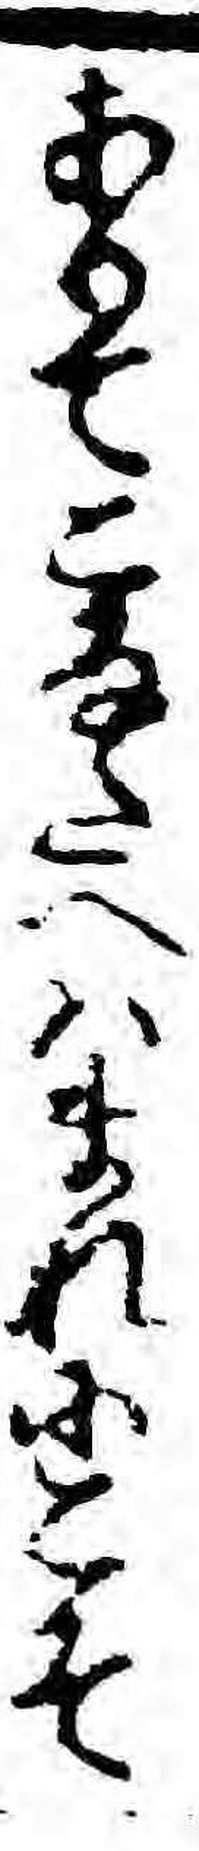ありてこなたへはまれにこそ
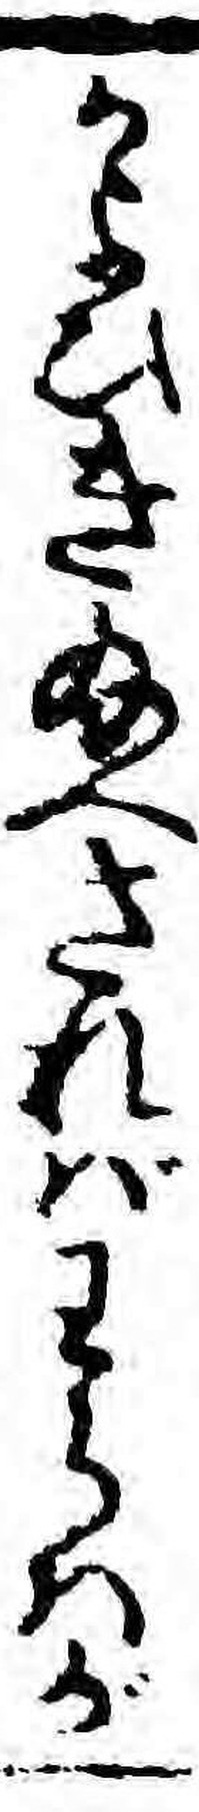かよひき給へさればわらはが
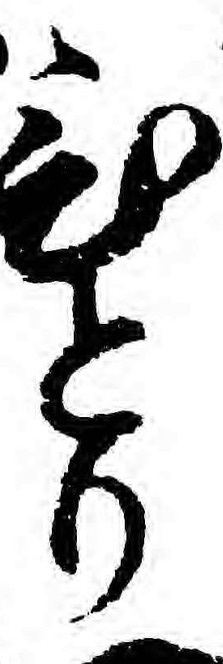ひとり
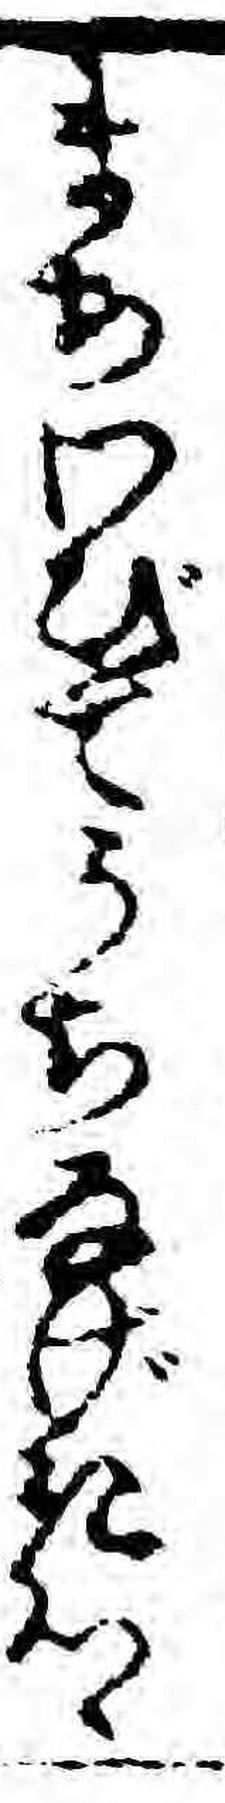まちわびてうちなげきつゝ
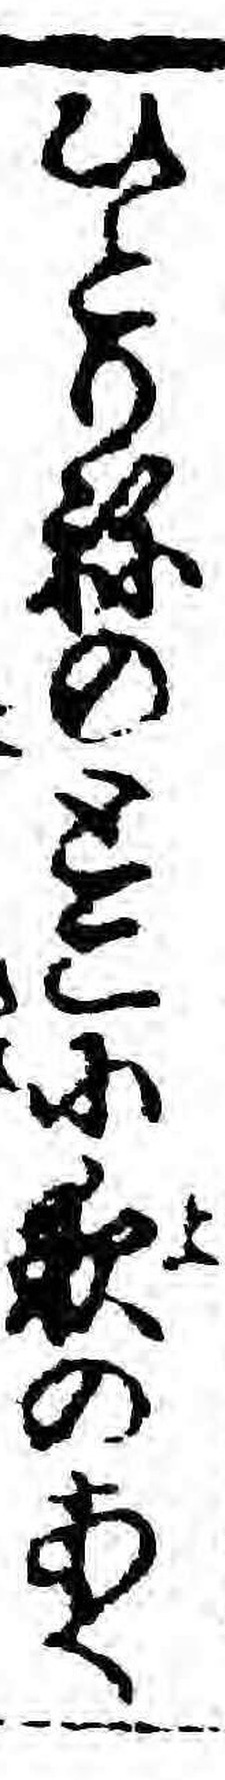ひとりねのとこに夜のあく
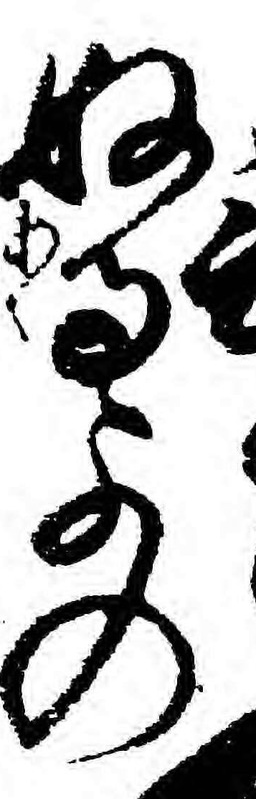ぬるよの
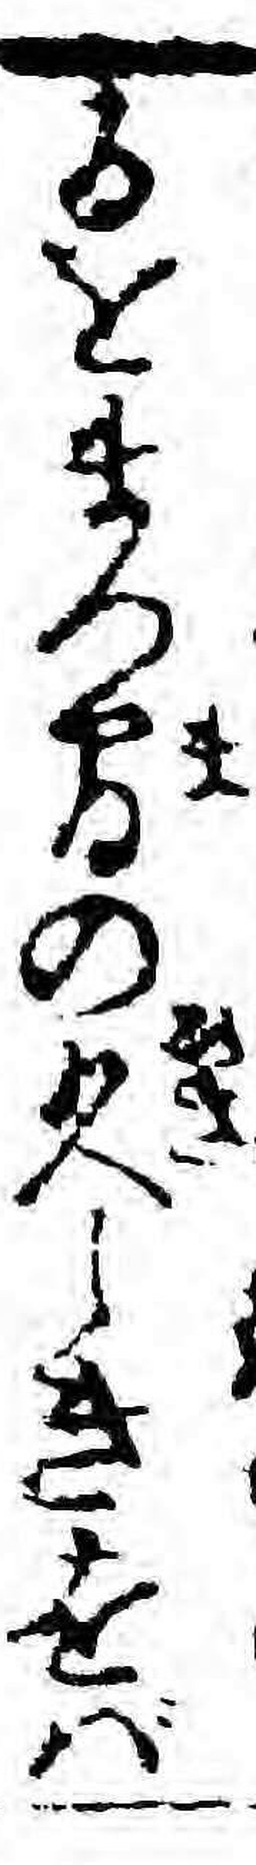るをまつ間の久しきをば
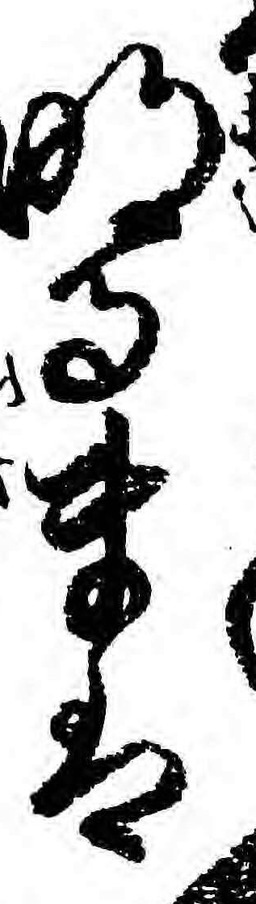明るまは
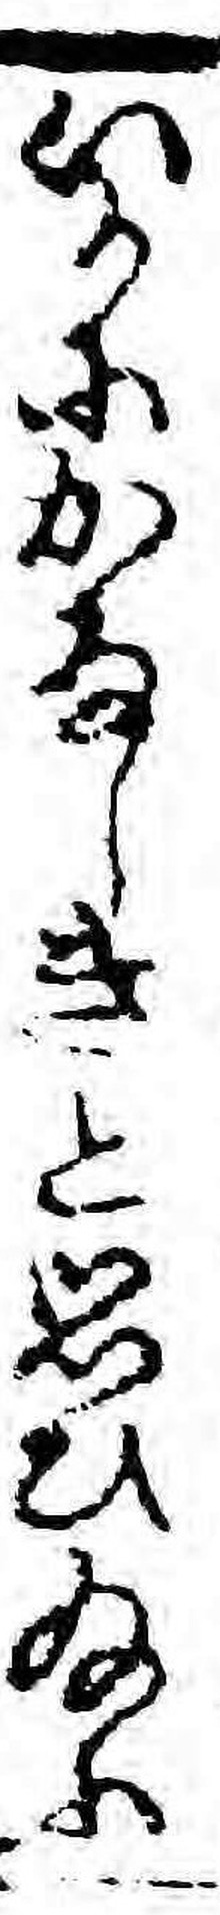いかにかなしきと思ひ給ふ
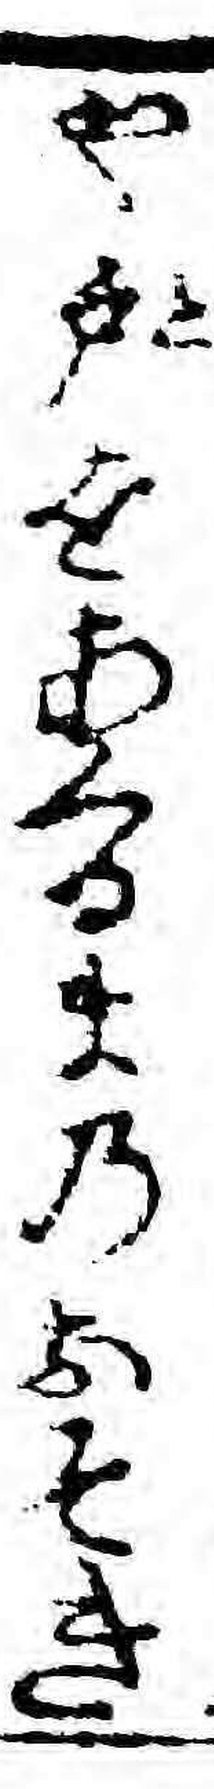や戸をあくるまのおそき
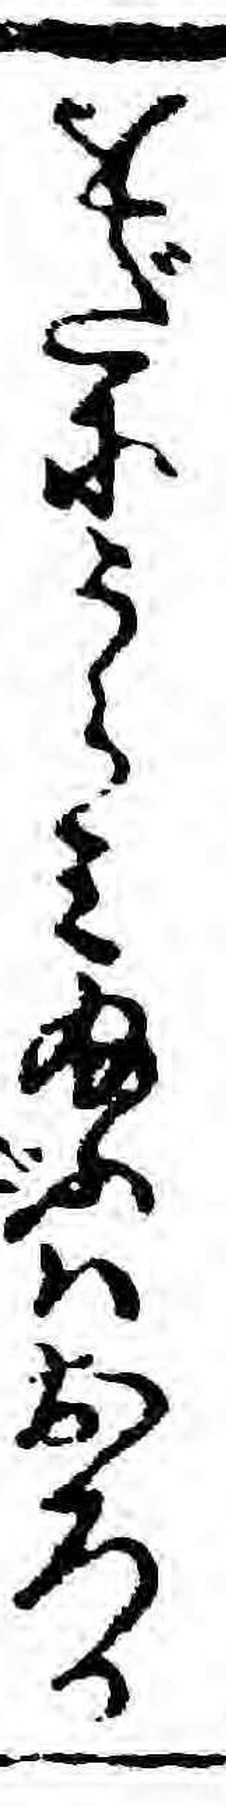をだにうらみ給ふはおろか
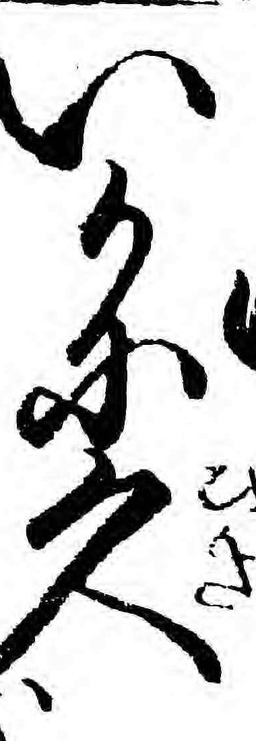いかに久
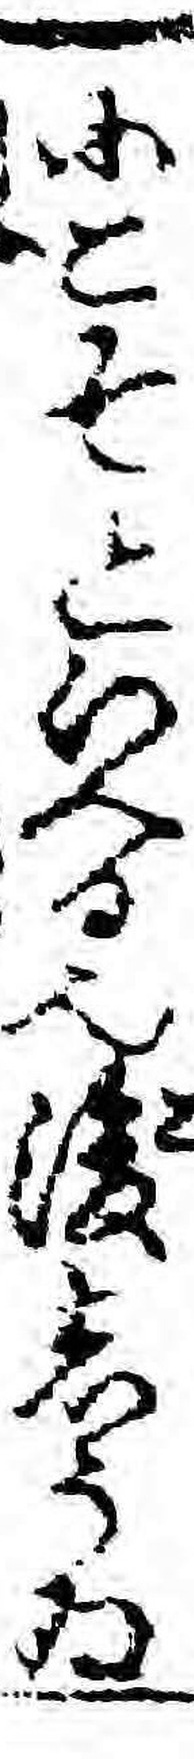にこそといへる也後しうゐ
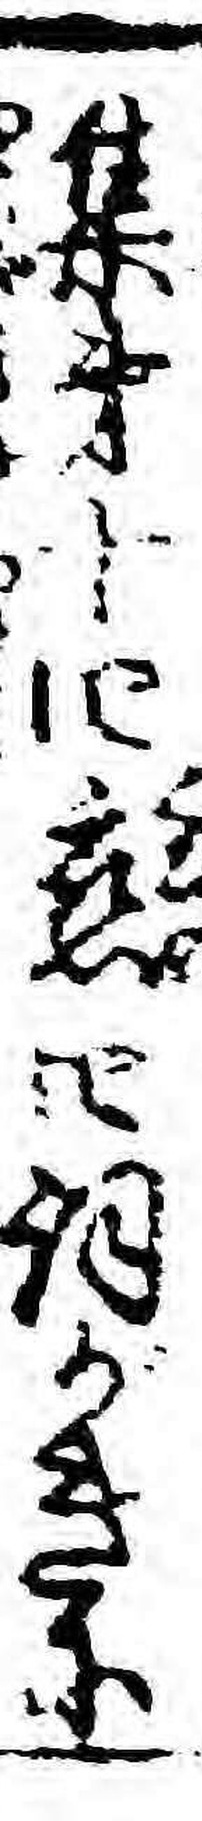集第十四恋四詞がきに
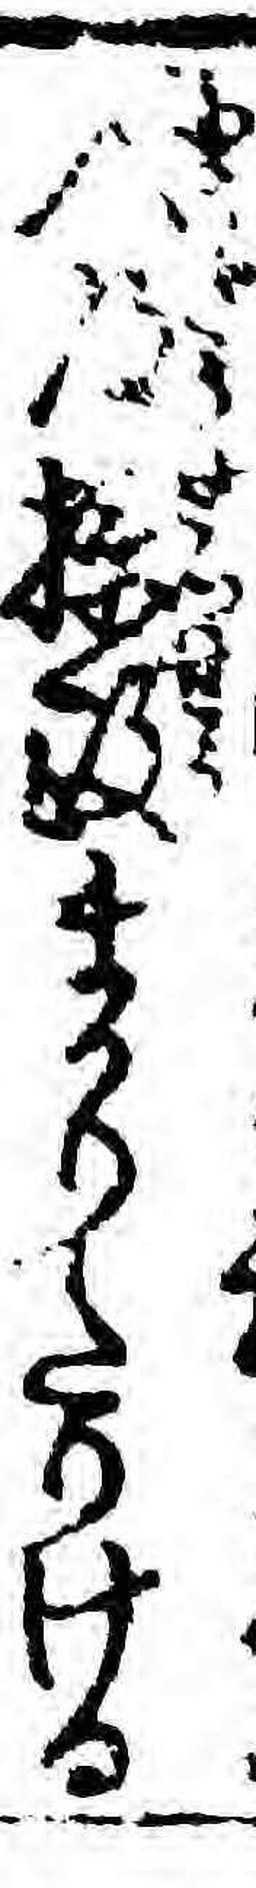入道摂政まかりたりける
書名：頭書和歌注譯／壽賀多百人一首小倉錦
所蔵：国文学研究資料館
